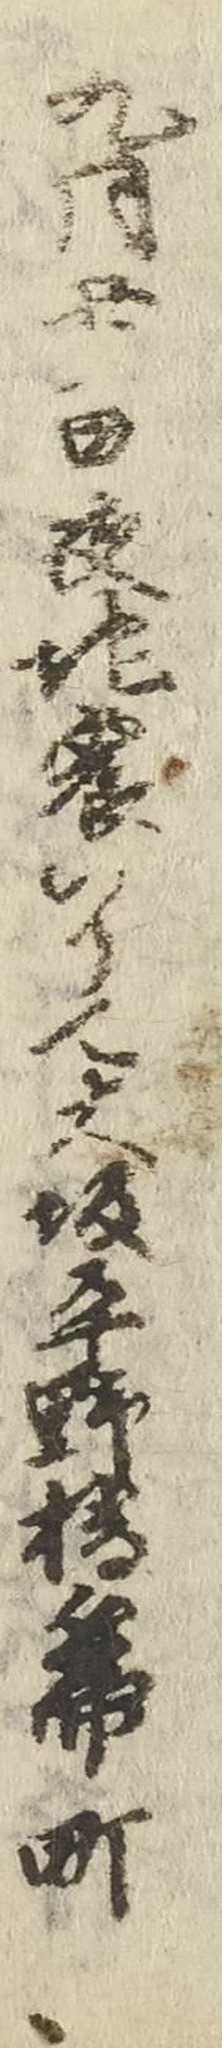九月廿八日夜地震いりて大坂平野橋箒町
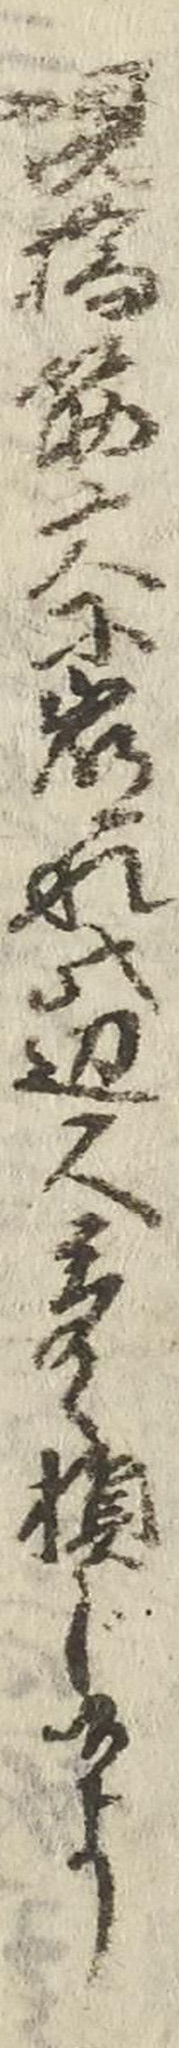蜆橋筋大に崩れ此辺人多く損じ候よし
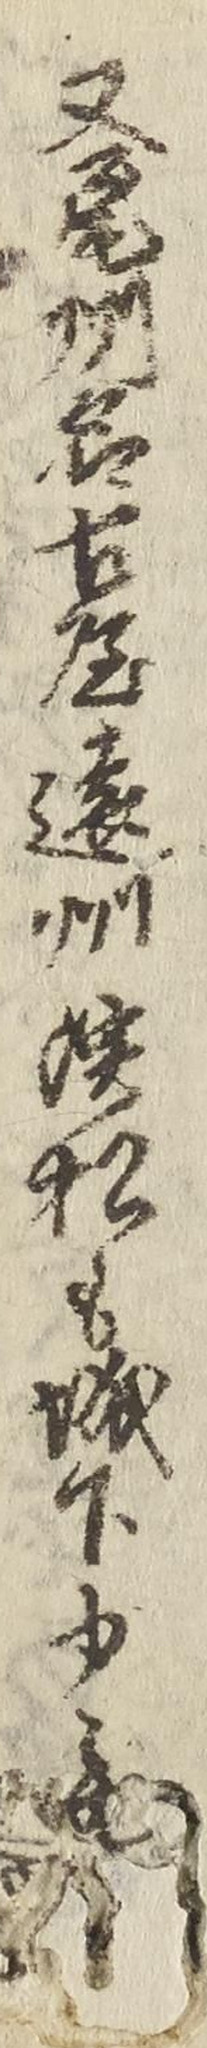又尾州名古屋遠州浜松も城下少しやけ
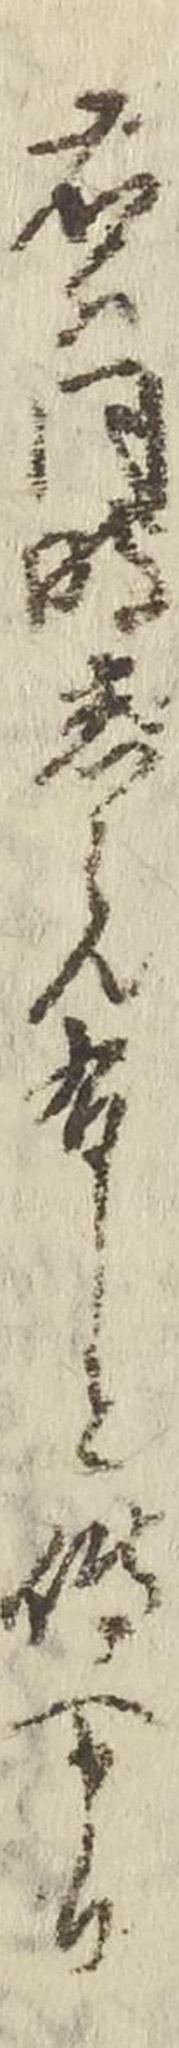右は同時じしん有之と伝へ申候
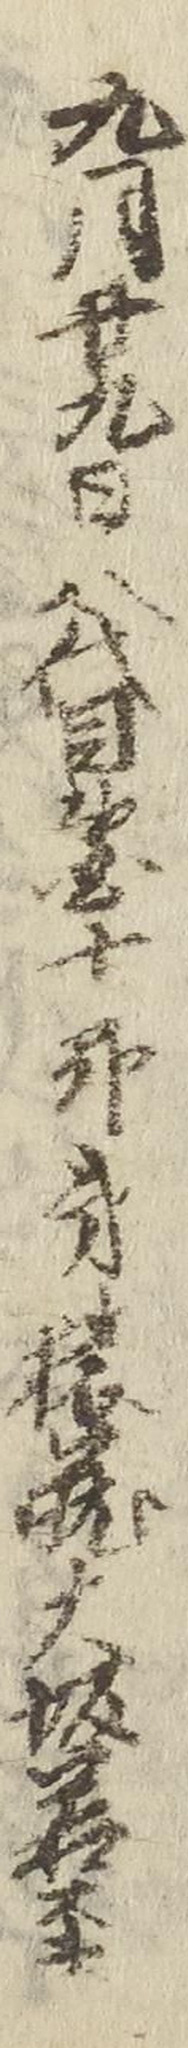九月廿九日八代目団十郎弟猿蔵大坂若大夫
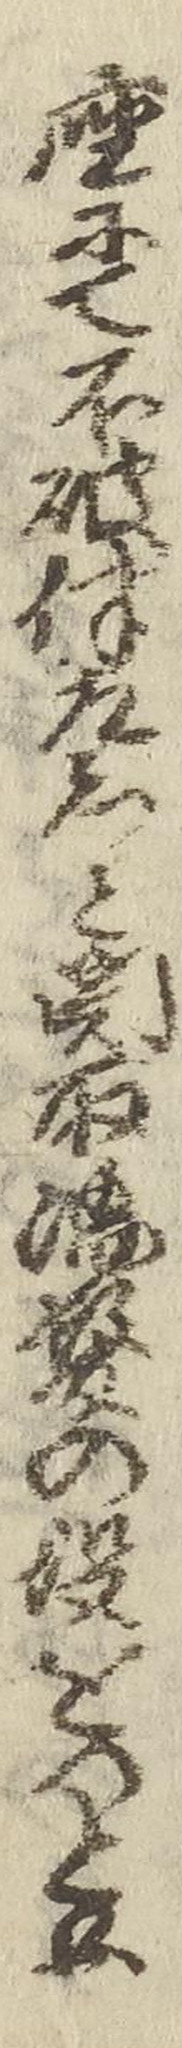座にて不破伝左衛門と関取濡髪の役をつとめ
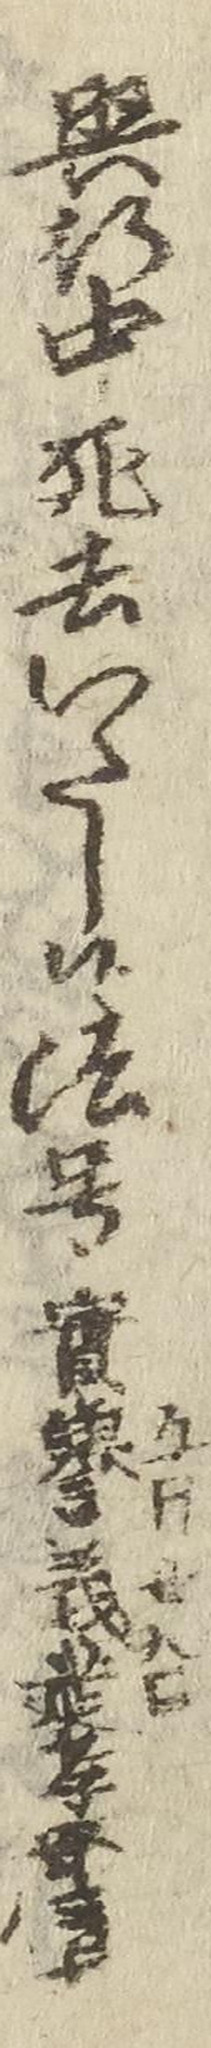興行中死去いたし候法号実誉義筵孝安信士
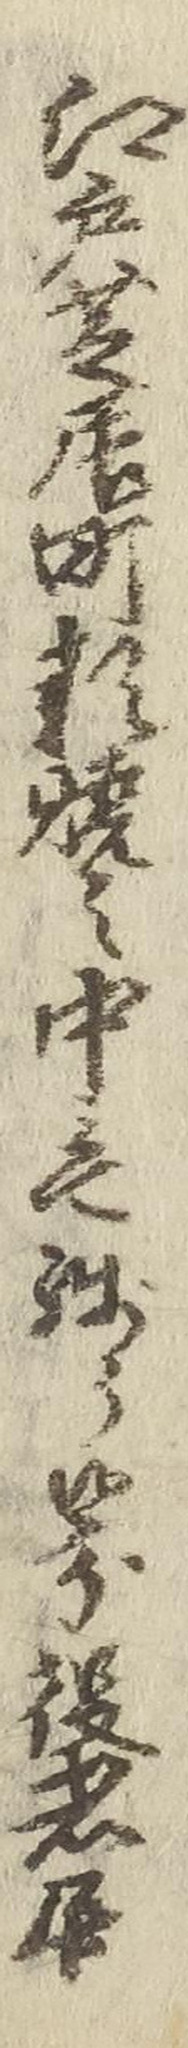江戸芝居町類焼の中にて残り候分役者居
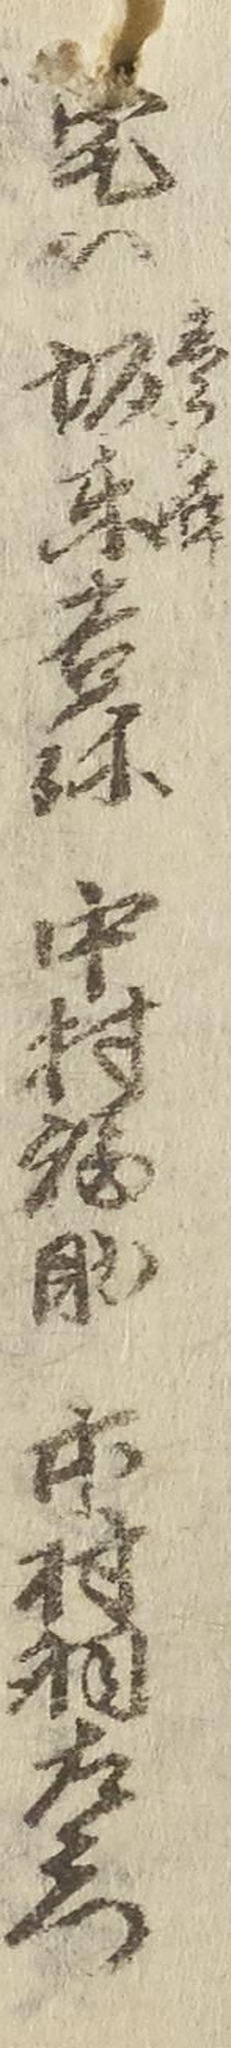宅ハ坂東吉弥中村福助市村羽左衛門
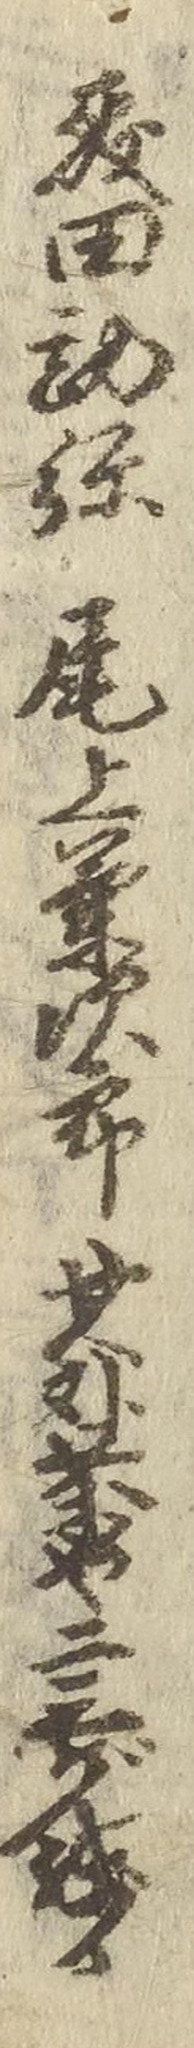森田勘弥尾上菊次郎其外茶や二三げん残る
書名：地震出火　男女死人怪我人書上之寫
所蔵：東京大学地震研究所図書室 Earthquake Research Institute Library, The University of Tokyo, JAPAN
